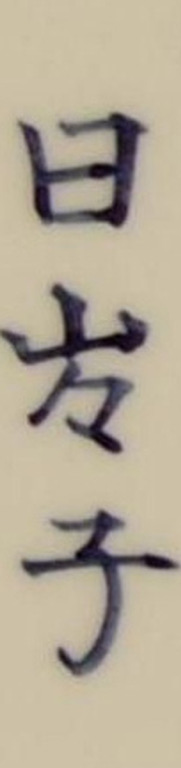日出子
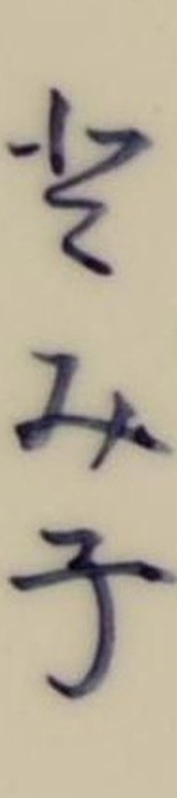とみ子
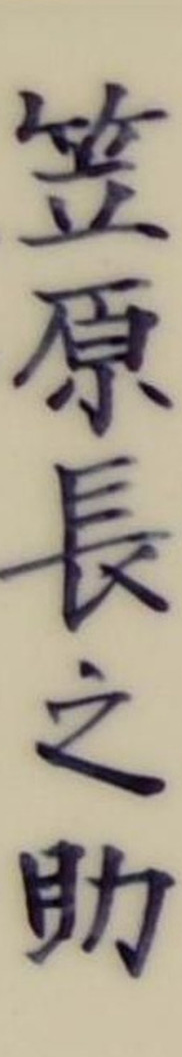笠原長之助
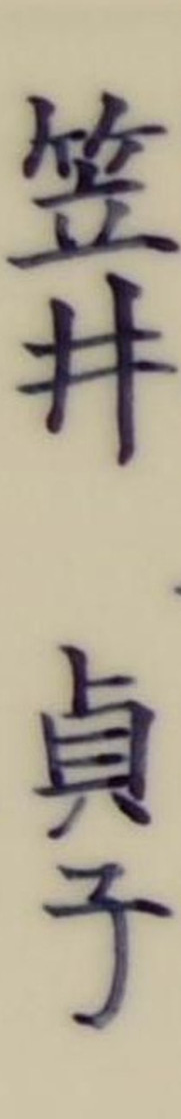笠井貞子

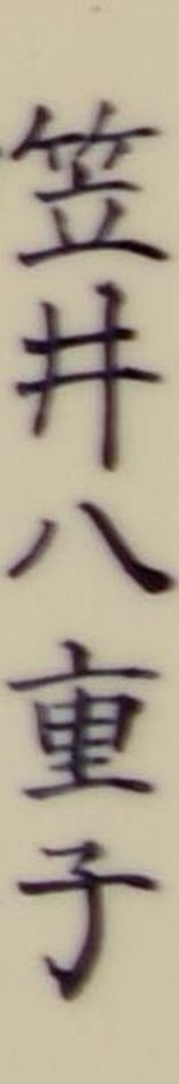笠井八重子
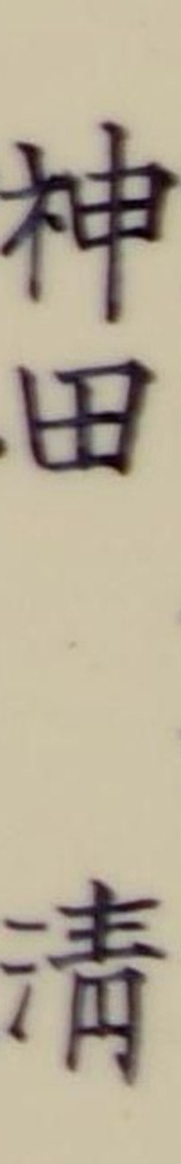神田清
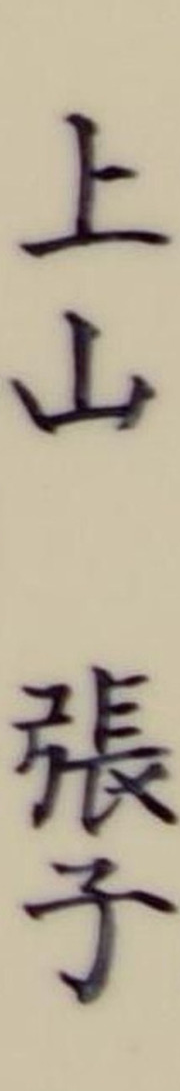上山張子
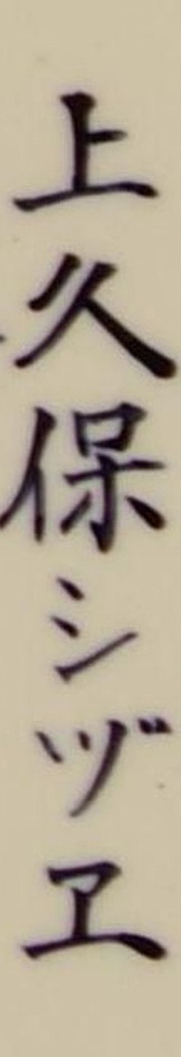上久保シヅヱ
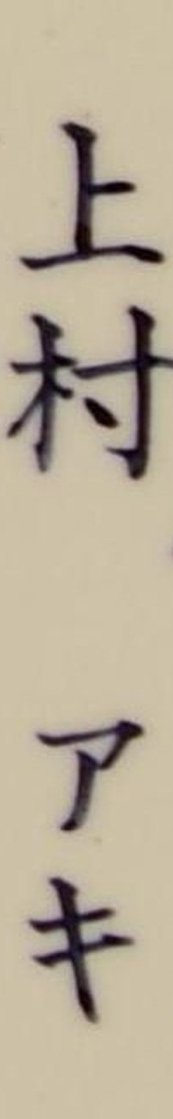上村アキ
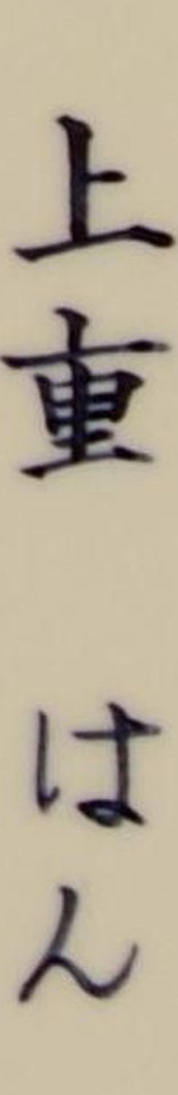上重はん
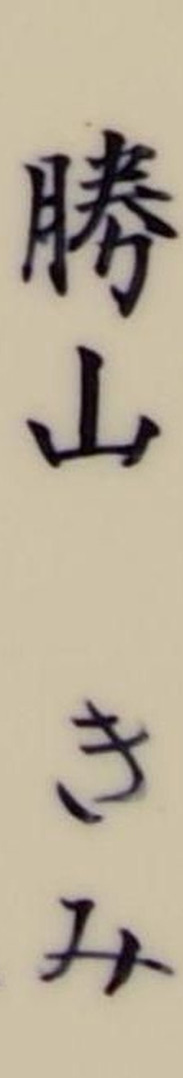勝山きみ
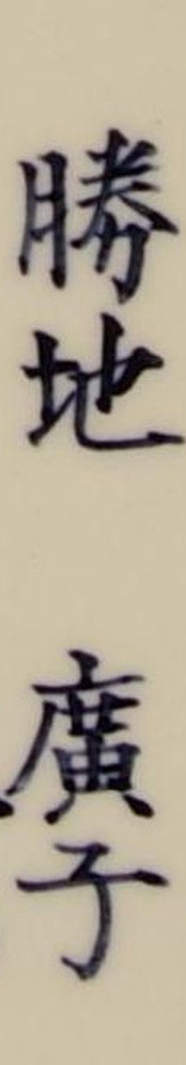勝地廣子
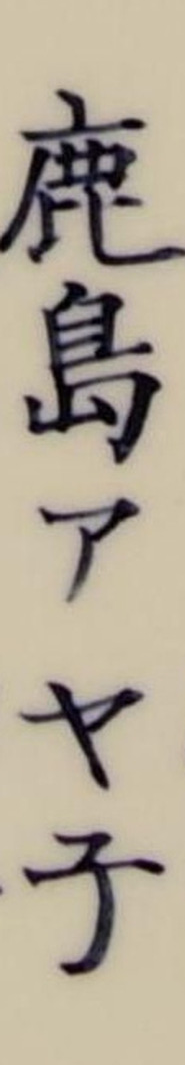鹿島アヤ子
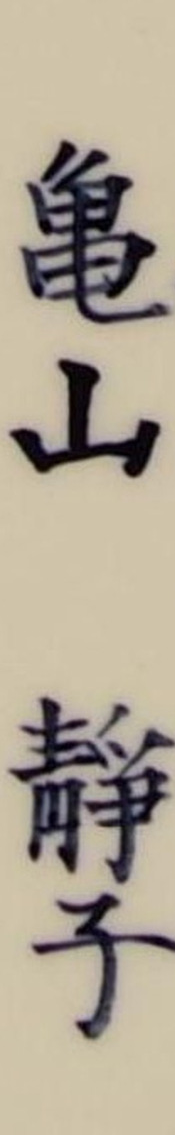亀山静子
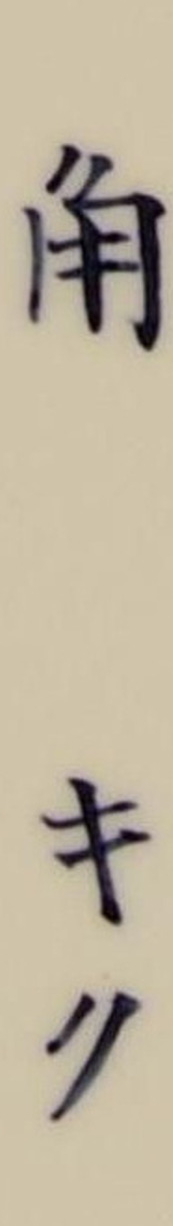角キク
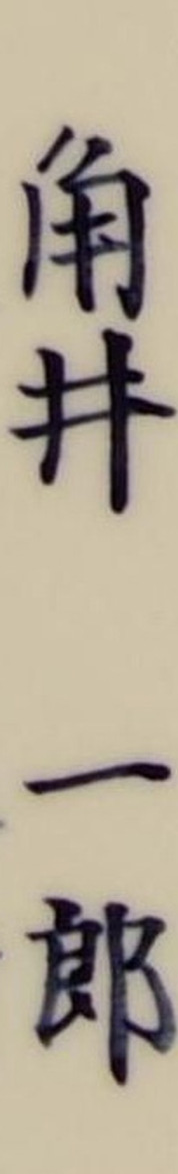角井一郎
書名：E~L
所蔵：高野山金剛峯寺
